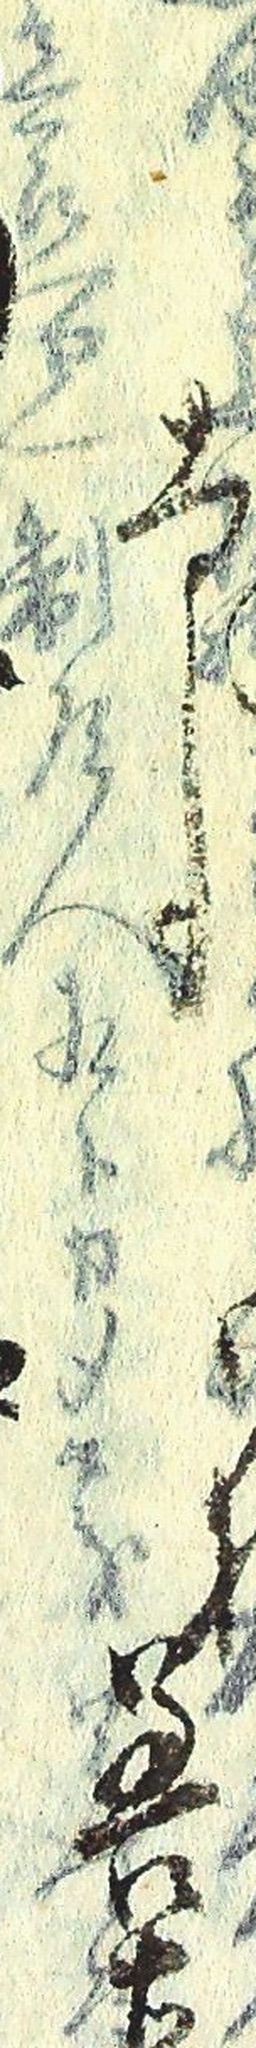善右衛門
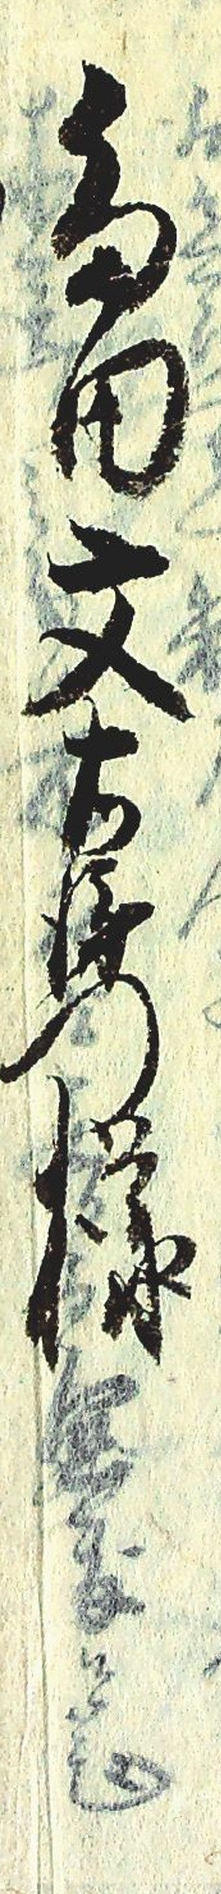多田文右衛門様
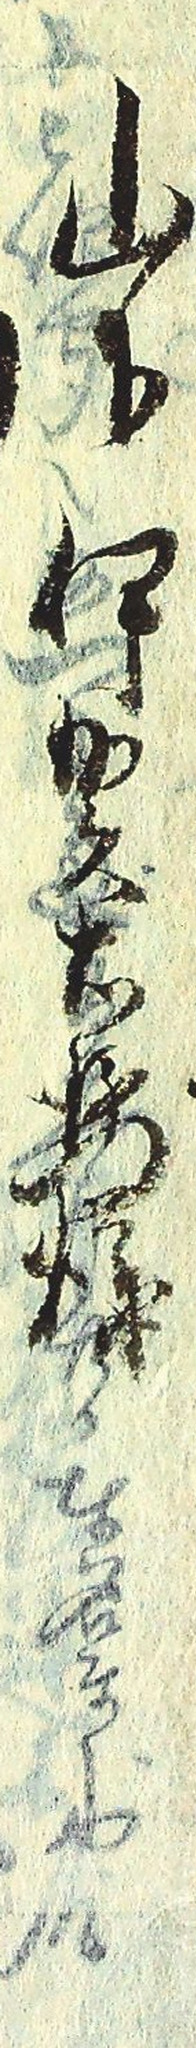山下伊賀右衛門様
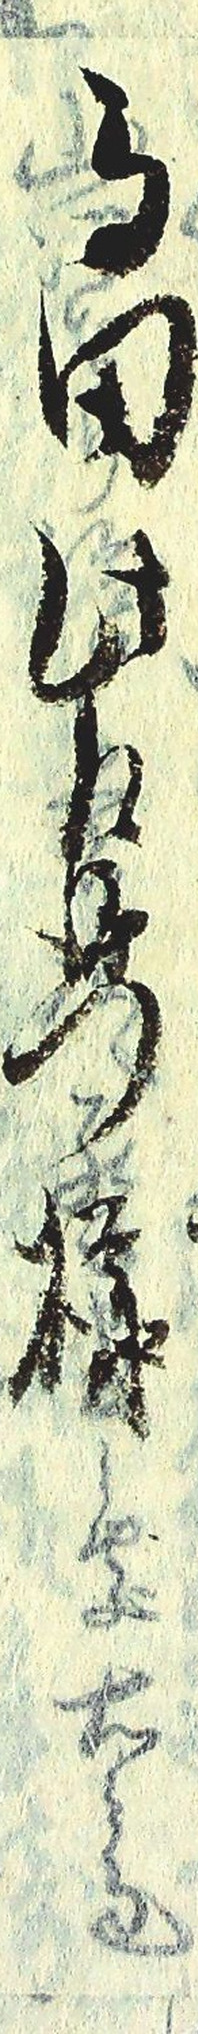高田此左衛門様
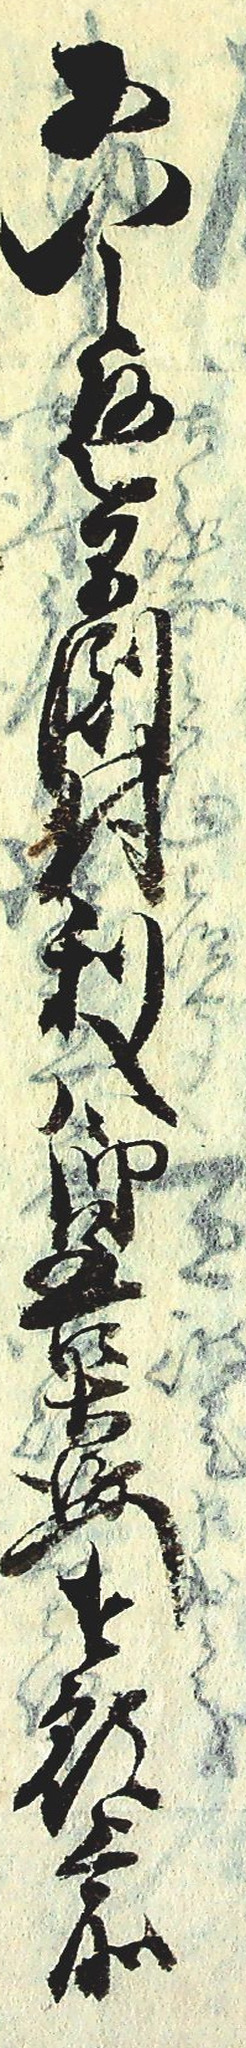右之通早淵村利八郎善右衛門奉願上所
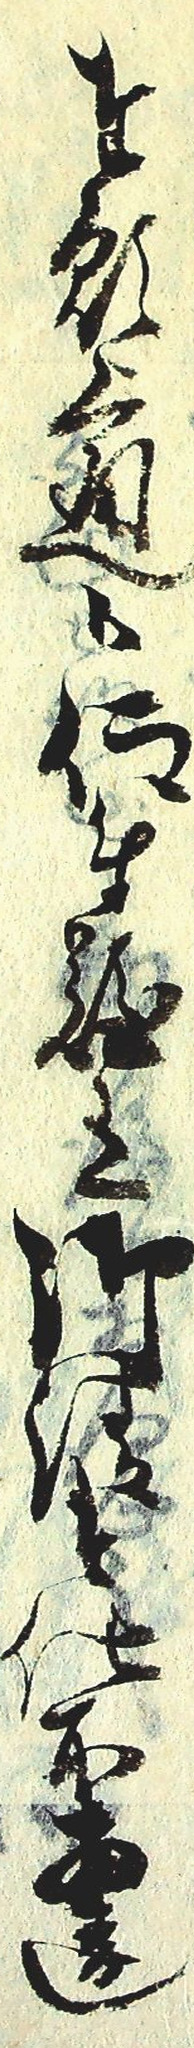奉願上通被仰付難有御請奉仕所相違
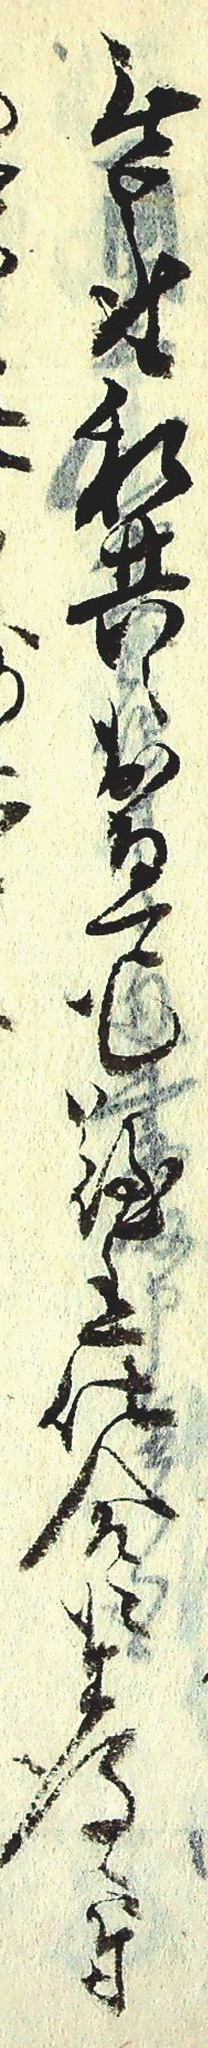無御座私共におゐても難有仕合に奉存候に付
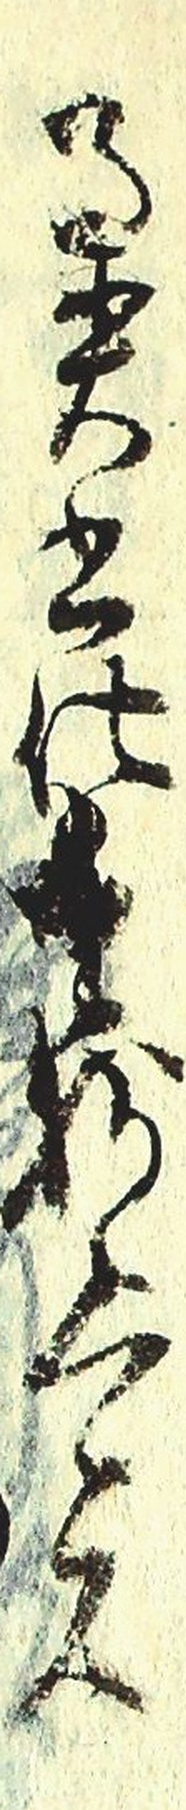奥書仕奉指上候以上
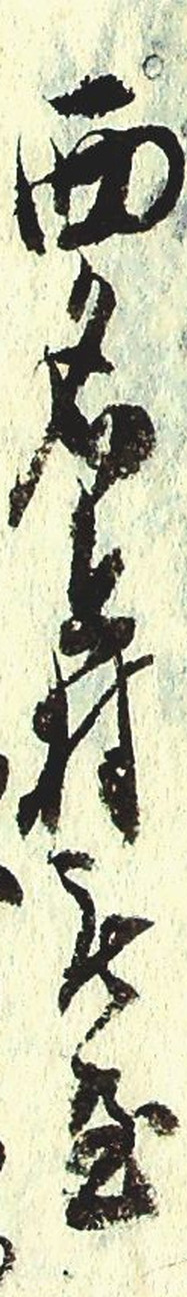西名東村庄屋
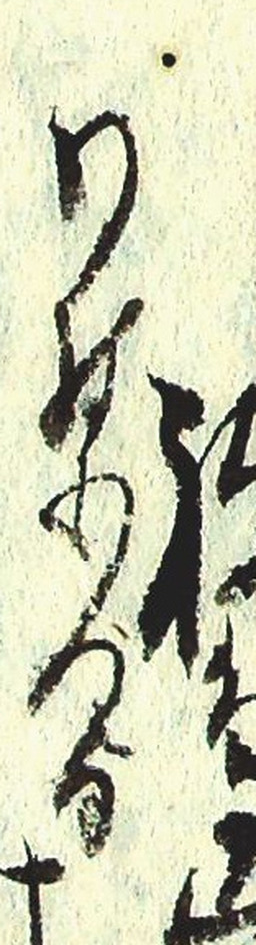同村五人与
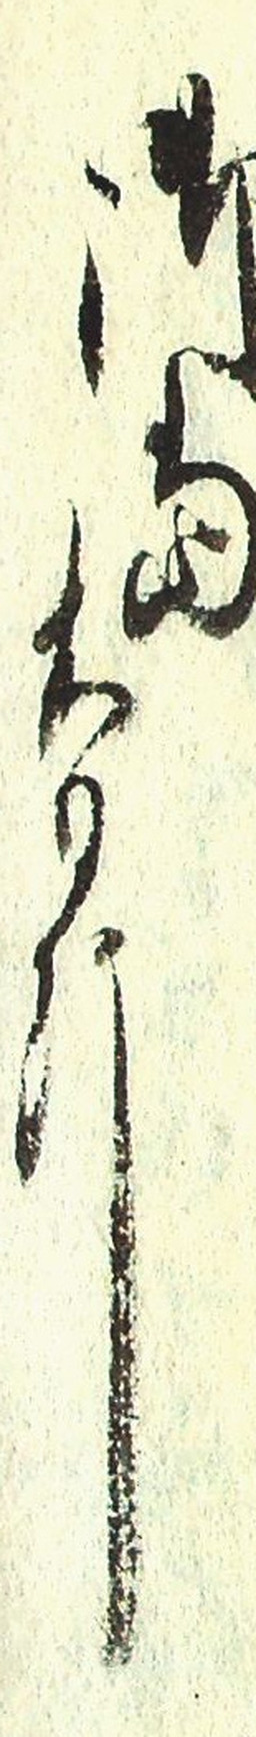右同断

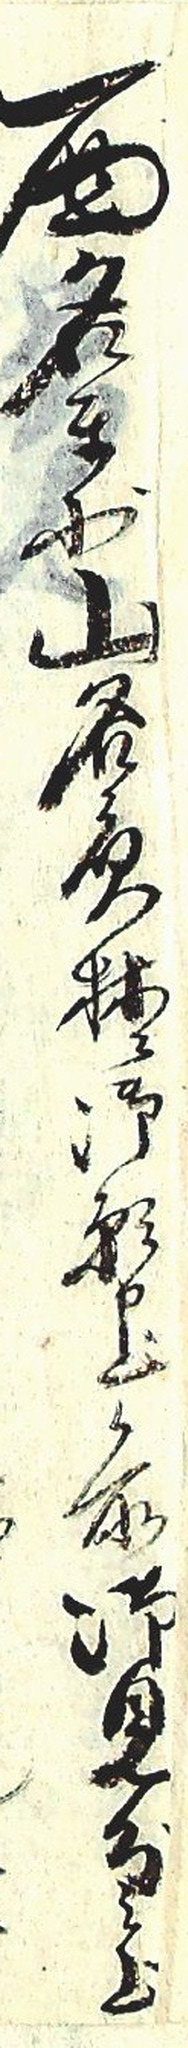西名東村山名負林に御願申上候所御見分之上
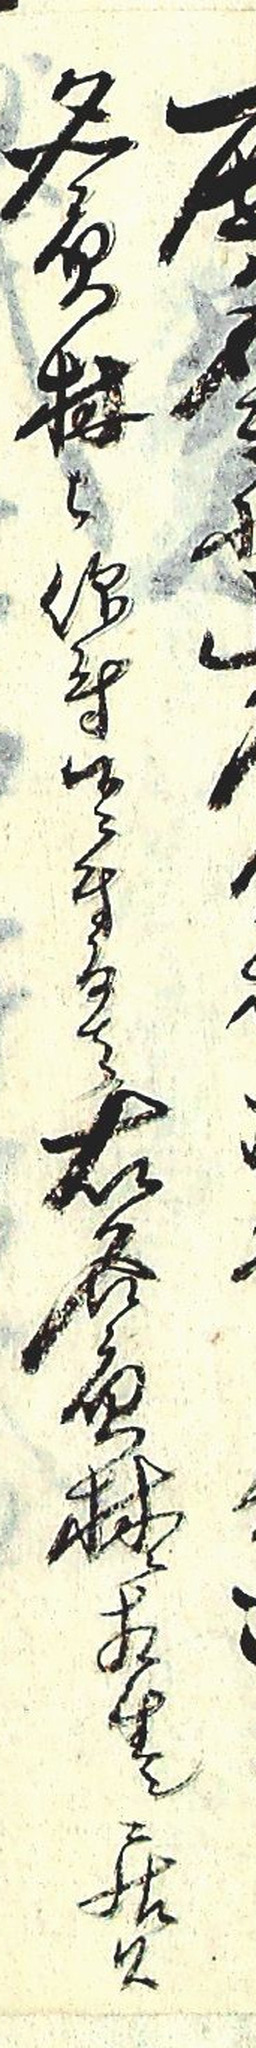名負林被仰付候に付ては右名負林に相生し居候
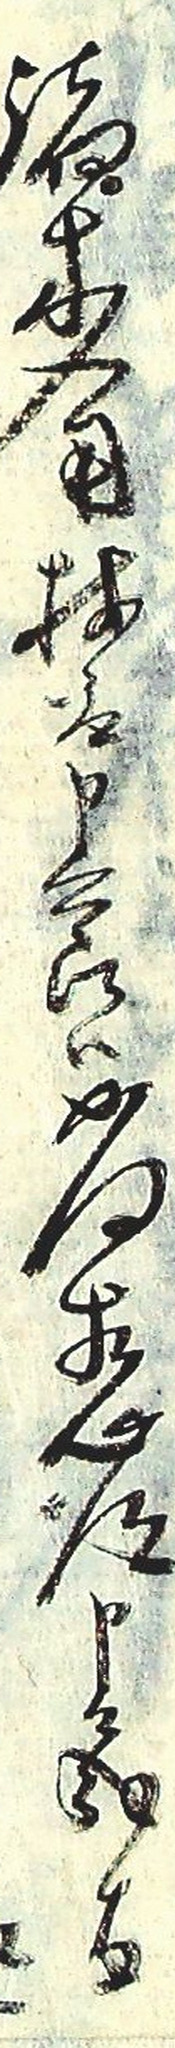諸木入用材取申節は如何相心得申候哉と
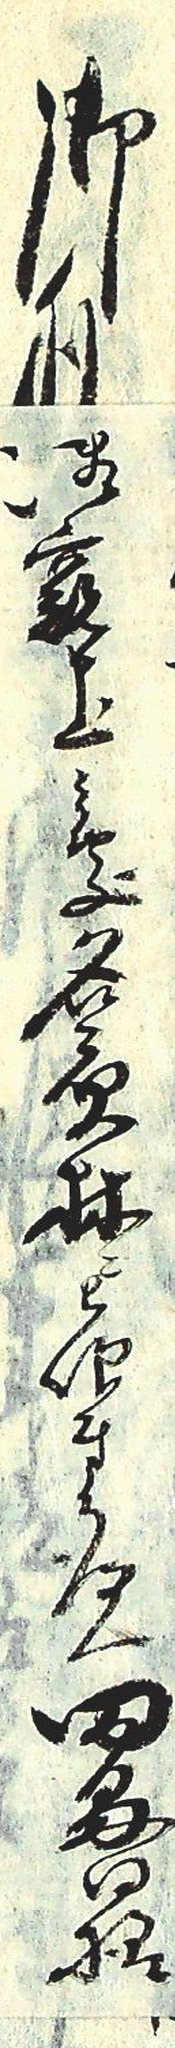御窺申上候処名負林に被仰付候得は田畠同様
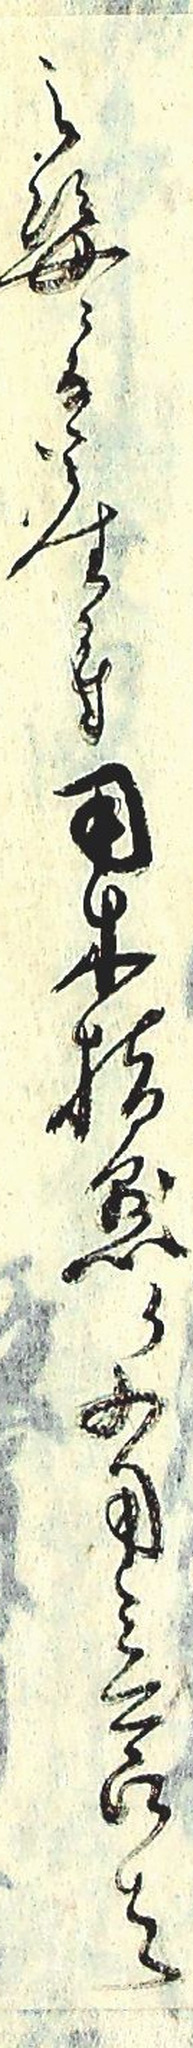之姿にて御座候付用木指懸り入用之節は
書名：諸御願書控(弐番）
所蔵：鳴門教育大学 Naruto University of Education
